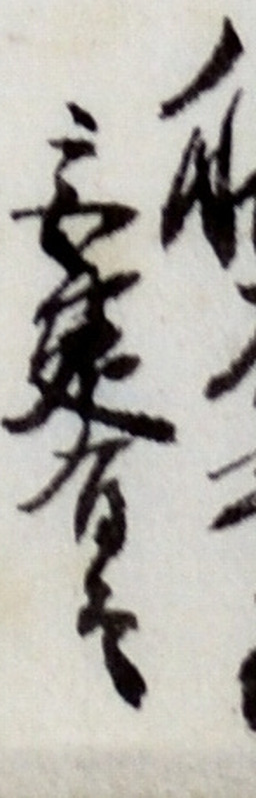宮建有之
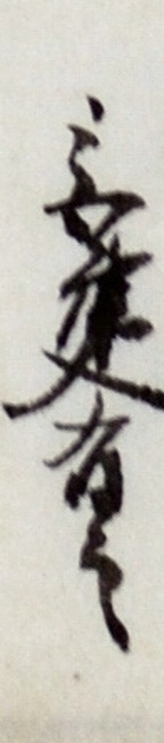宮建有之
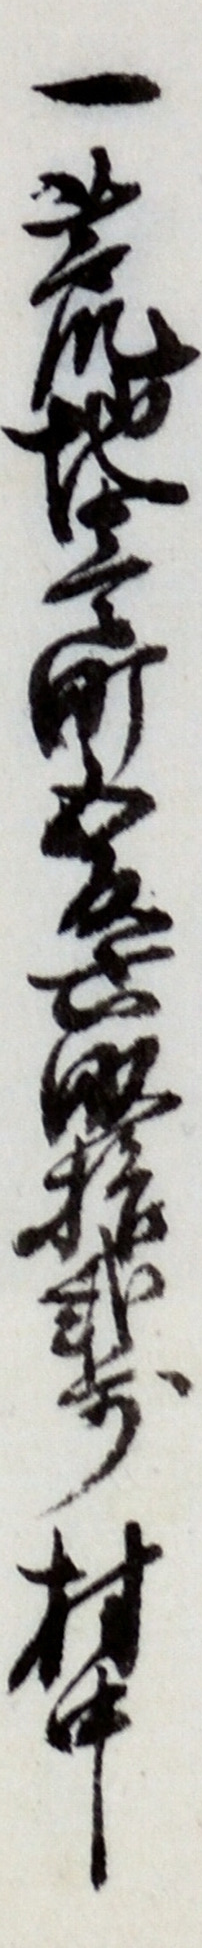一荒地壱町五反六畝拾弐歩村中
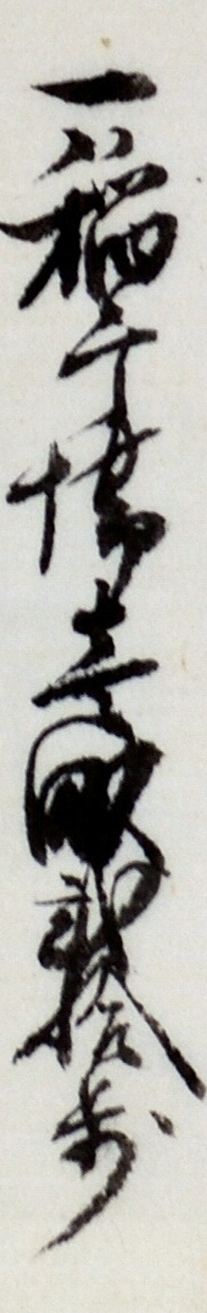一稲干場壱畝弐拾歩
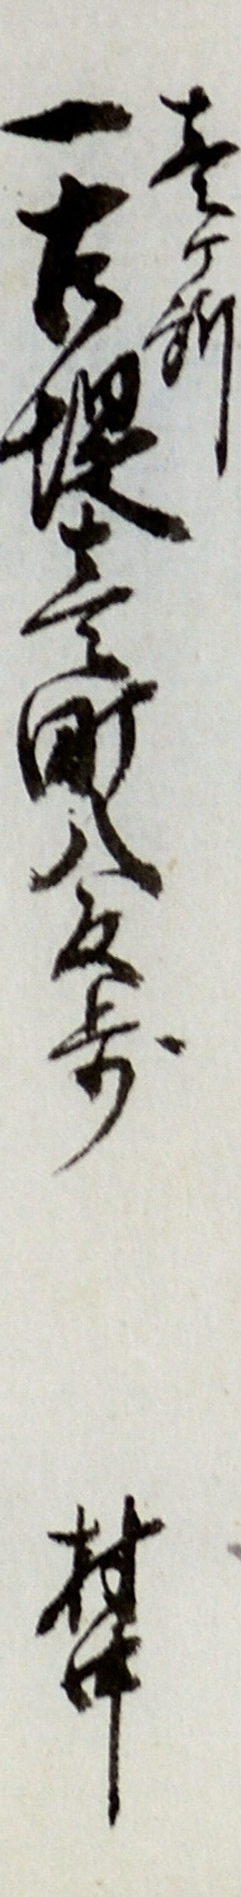一古堤壱町八反歩村中
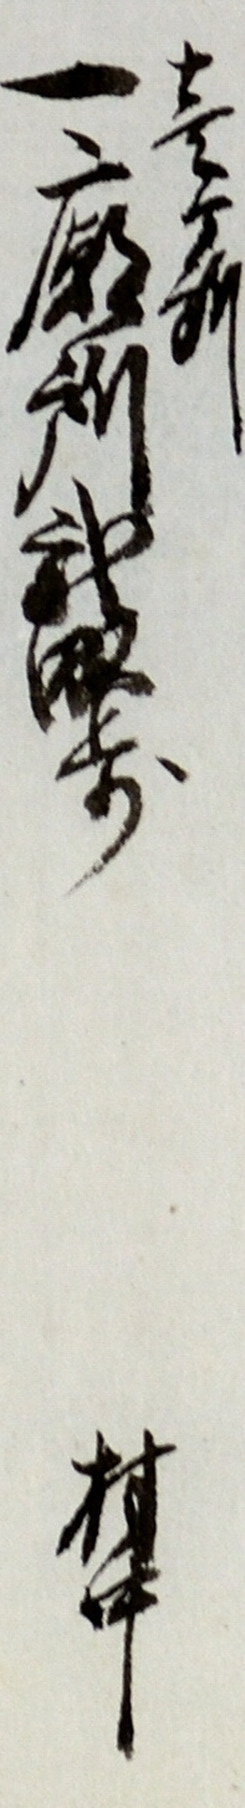一廟所弐畝歩村中
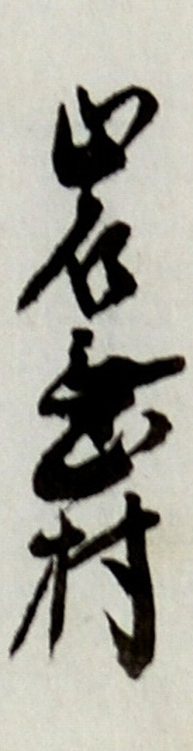岩出村
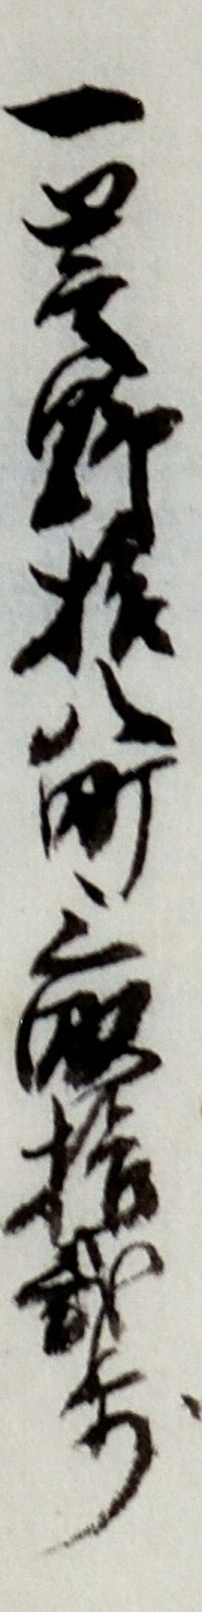一芝野拾八町三畝拾弐歩

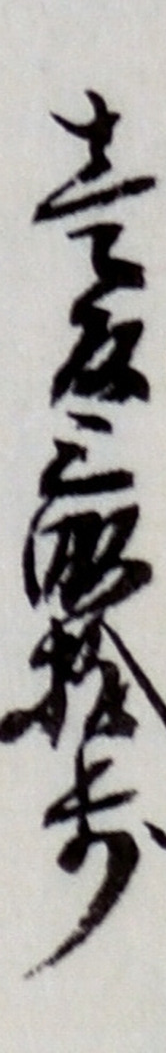壱反三畝拾歩同断
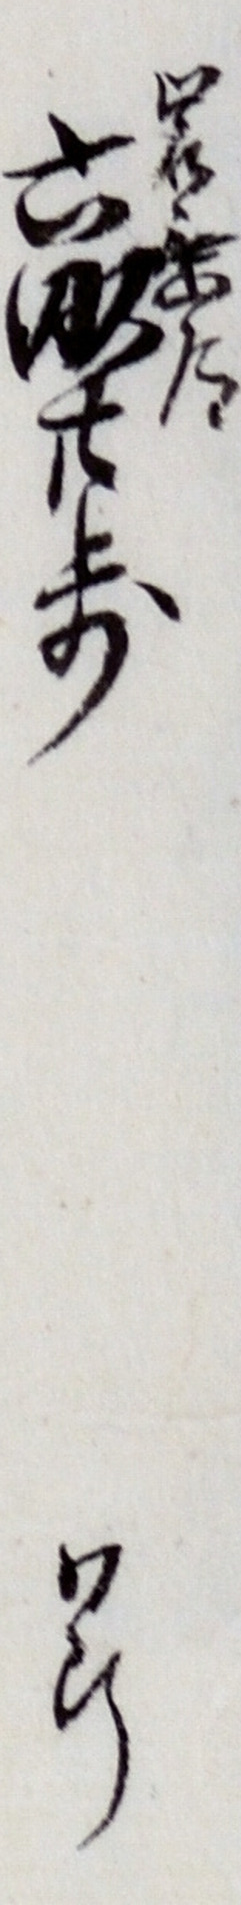六畝廿歩同断
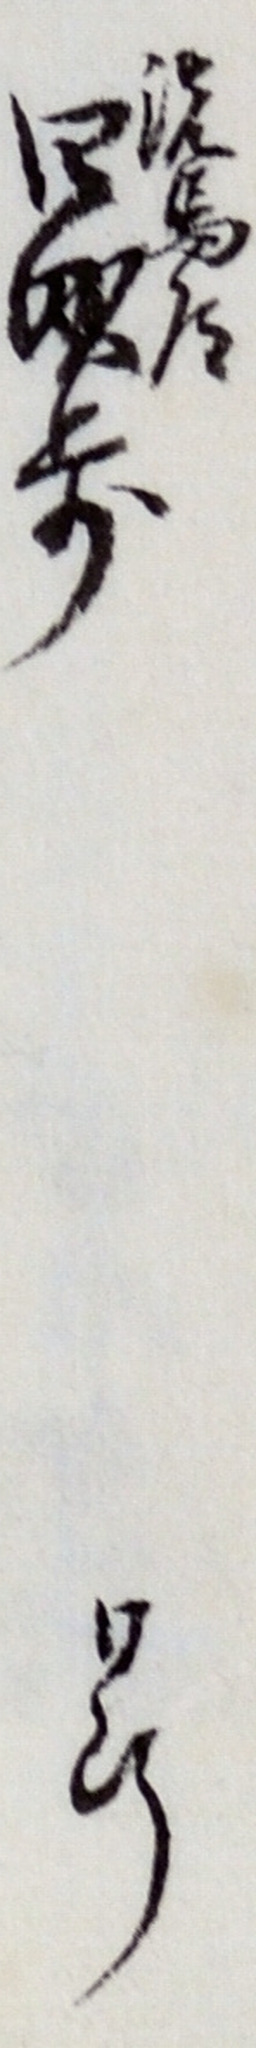四畝歩同断
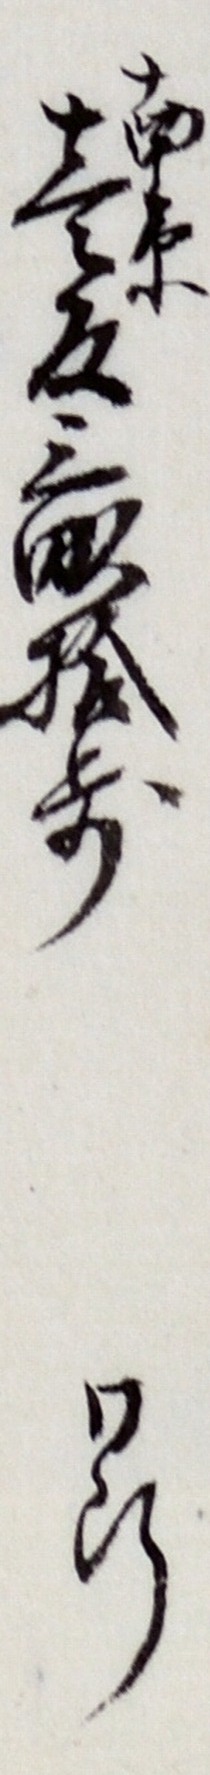壱反三畝拾歩同断
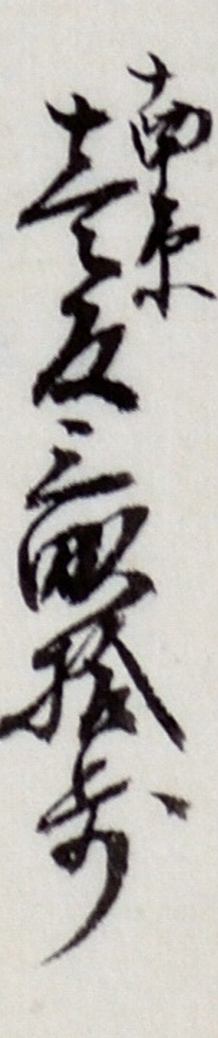壱反三畝拾歩同断
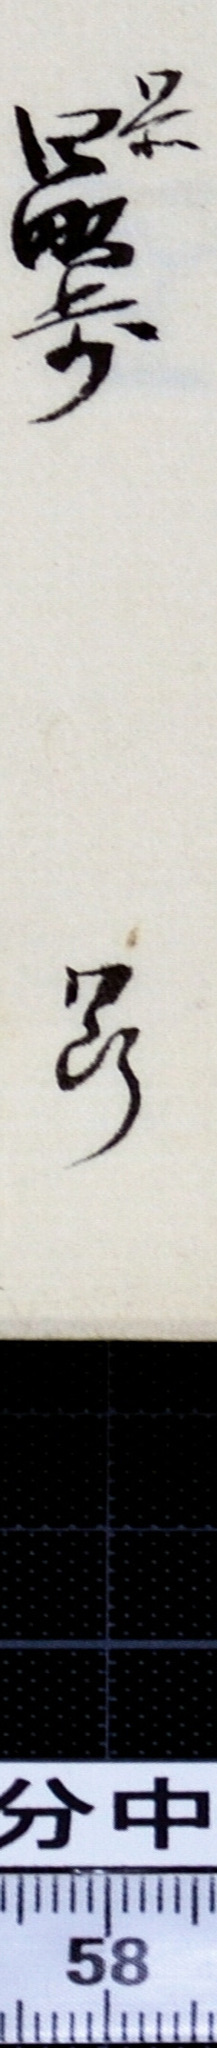四畝歩同断
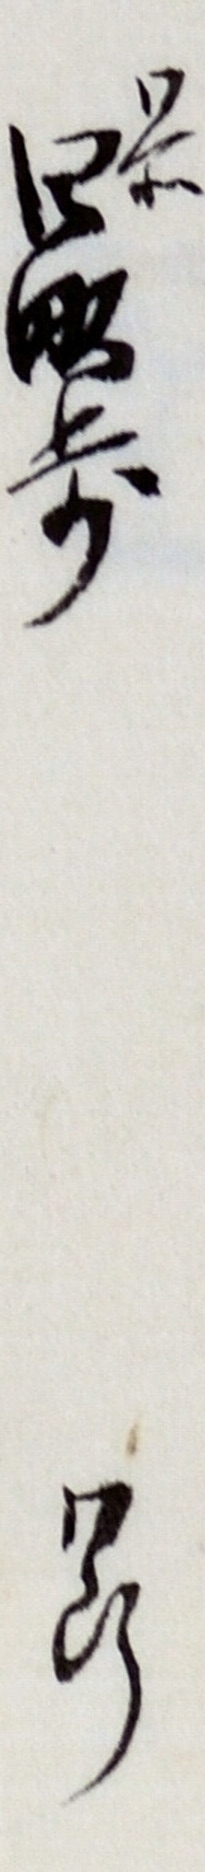四畝歩同断
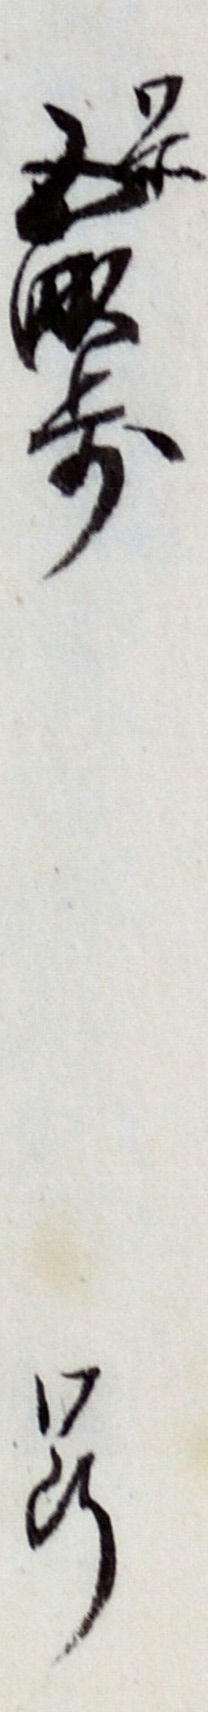五畝歩同断
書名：御領分中山林社地手控
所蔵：伊那市立高遠町図書館・合同会社AMANE
